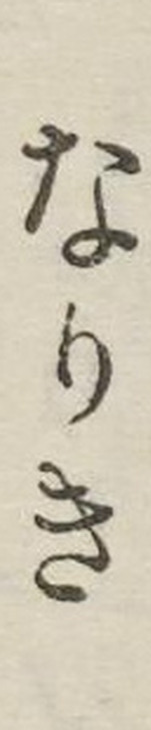なりき
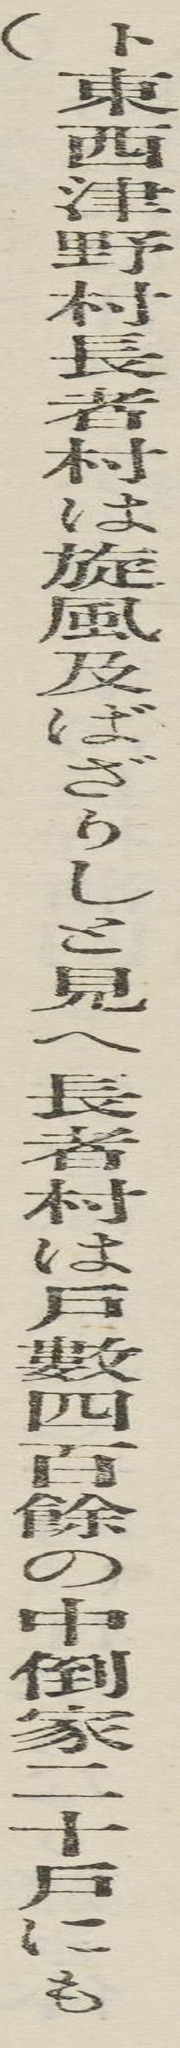東西津野村長者村は旋風及ばざりしと見へ長者村は戸数四百余の中倒家二十戸にも
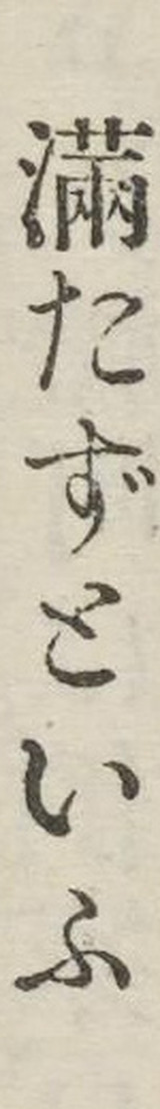満たずという
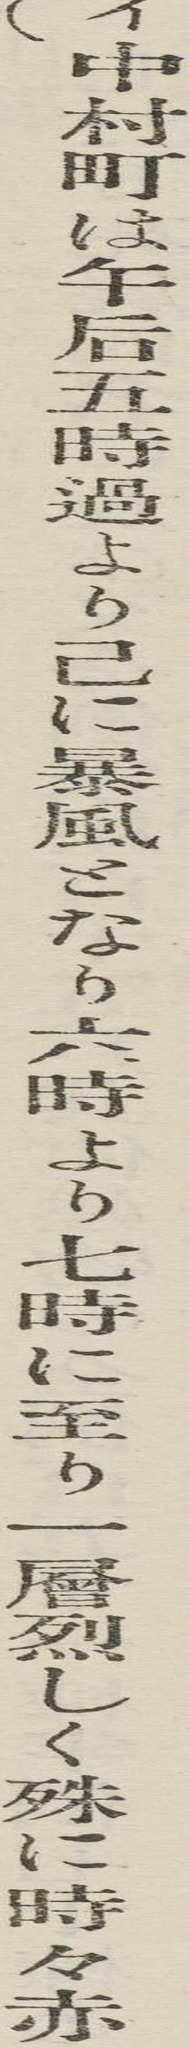中村町は午后五時過より己に暴風となり六時より七時に至り一層烈しく殊に時々赤
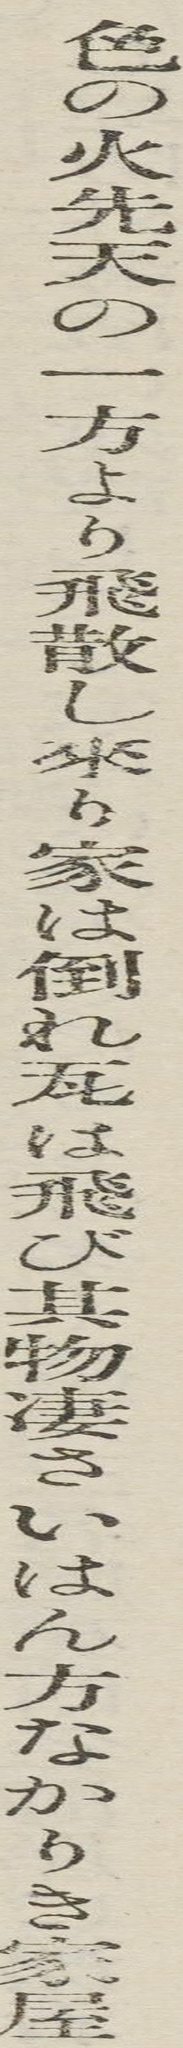色の火先天の一方より飛散し来り家は倒れ瓦は飛び其物凄さいはん方なかりき家屋
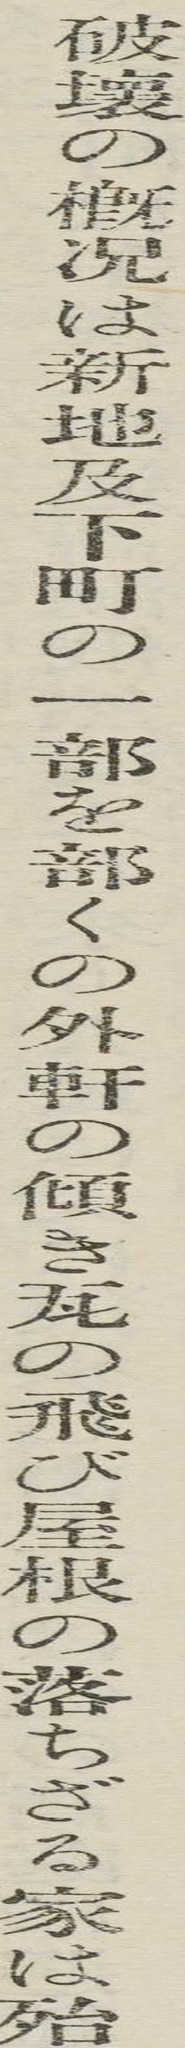破壊の概況は新地及下町の一部を部くの外軒の傾き瓦の飛び屋根の落ちざる家は殆
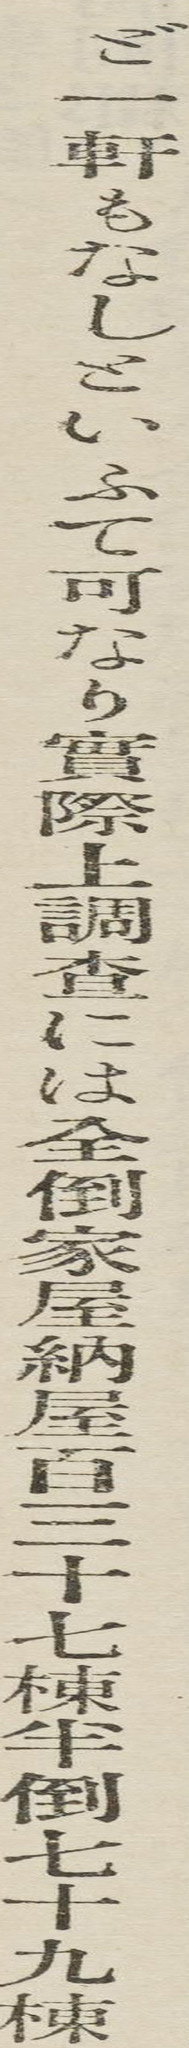ど一軒もなしといふて可なり実際上調査には全倒家屋納屋百三十七棟半倒七十九棟
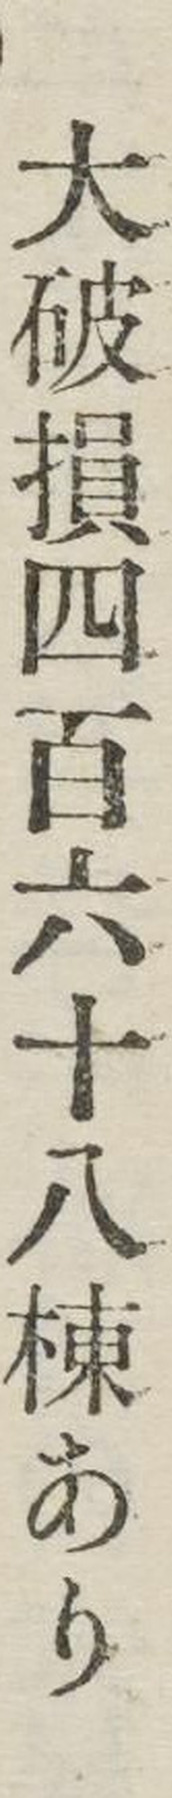大破損四百六十八棟あり
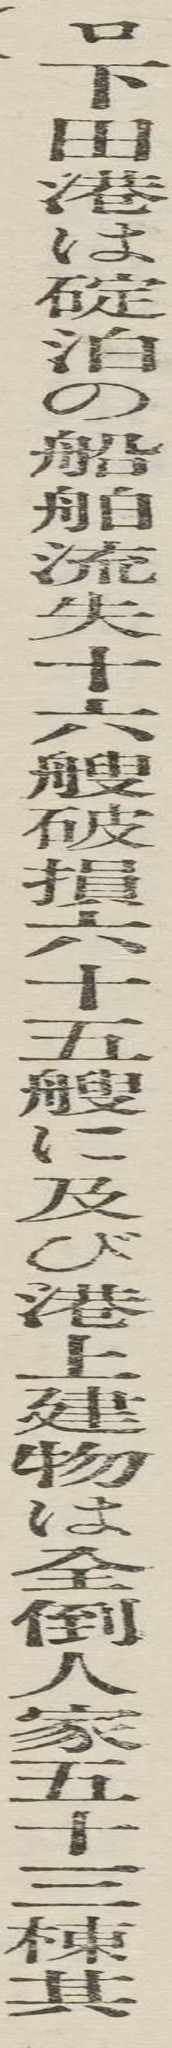下田港は碇泊の船舶流失十六艘破損六十五艘に及び港上建物は全倒人家五十三棟其
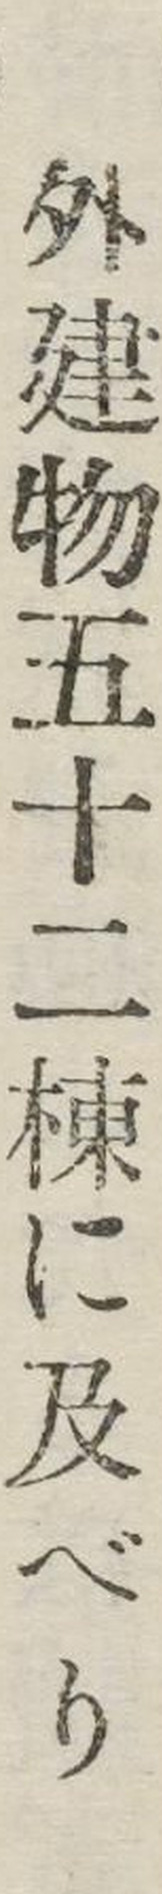外建物五十二棟に及べり
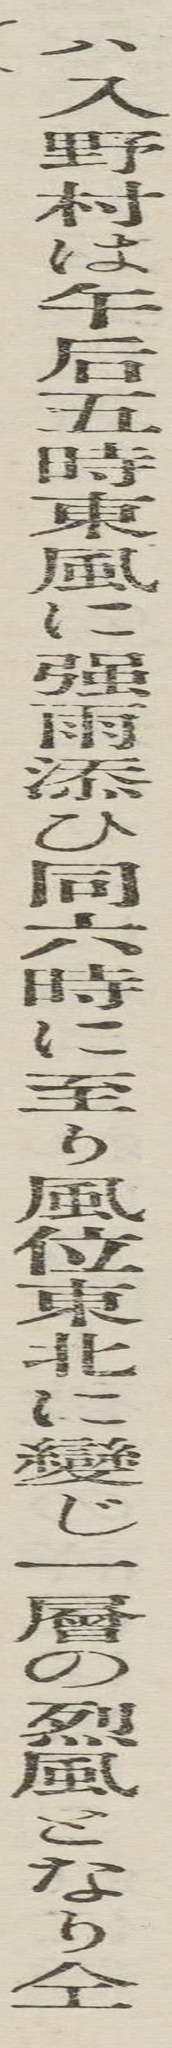入野村は午后五時東風に強雨添ひ同六時に至り風位東北に変じ一層の烈風となり仝
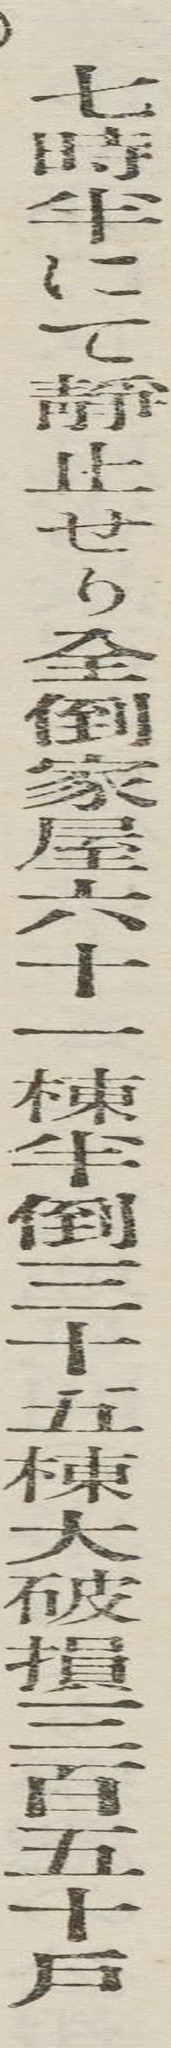七時半にて静止せり全倒家屋六十一棟半倒三十五棟大破損三百五十戸
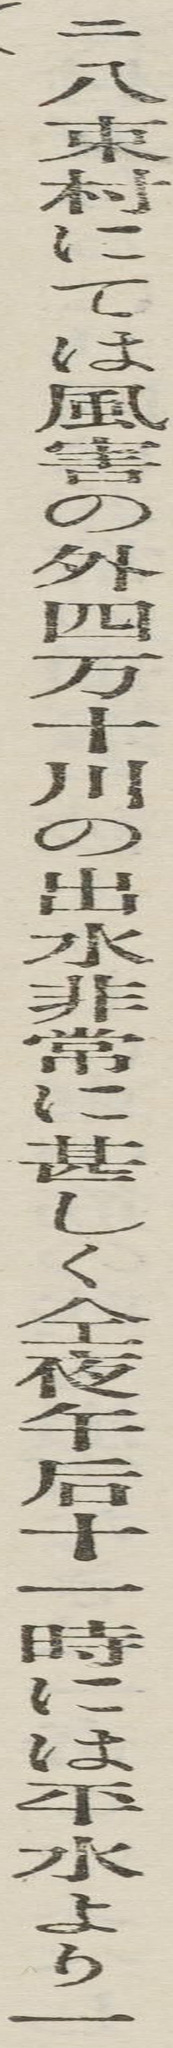八束村にては風害の外四万十川の出水非常に甚しく仝夜午后十一時には平水より一
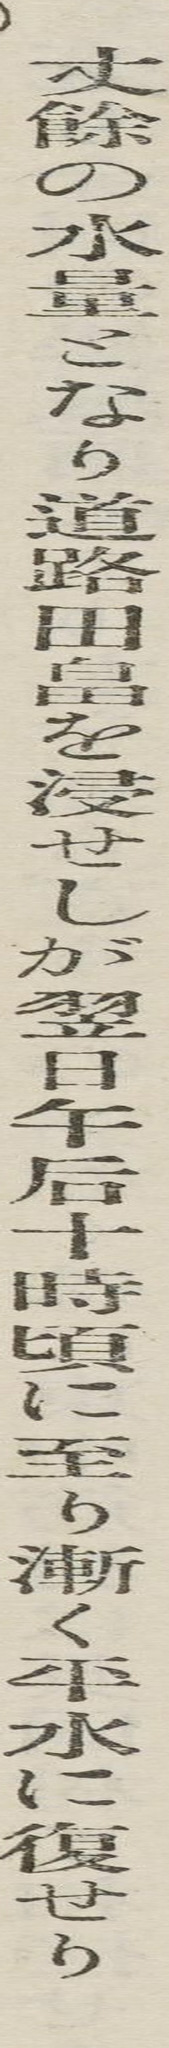丈余の水量となり道路田畠を浸せしが翌日午后十時頃に至り漸く平水に復せり
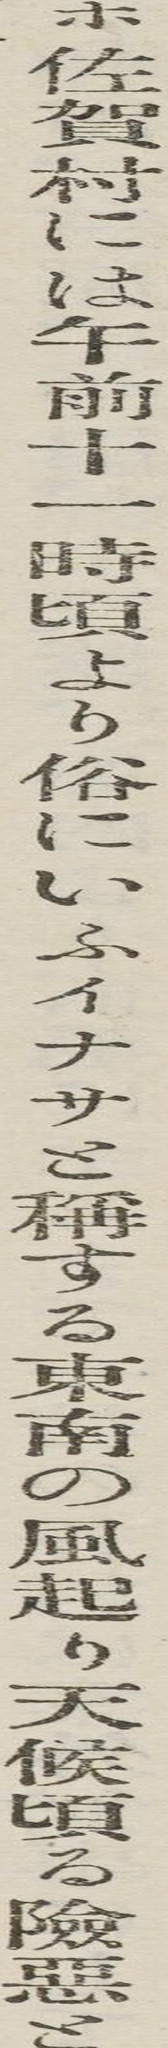佐賀村には午前十一時頃より俗にいふイナサと称する東南の風起り天候頃る険悪と
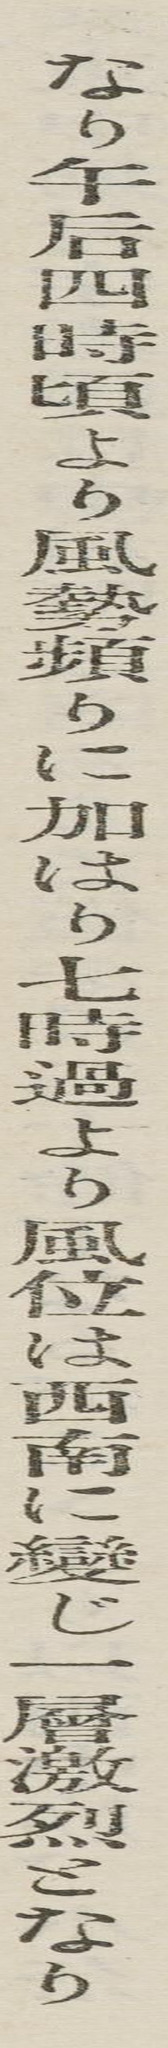なり午後四時頃より風勢頻りに加はり七時過より風位は西南に変じ一層激烈となり
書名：土佐古今ノ地震
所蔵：東京大学地震研究所図書室 Earthquake Research Institute Library, The University of Tokyo, JAPAN
